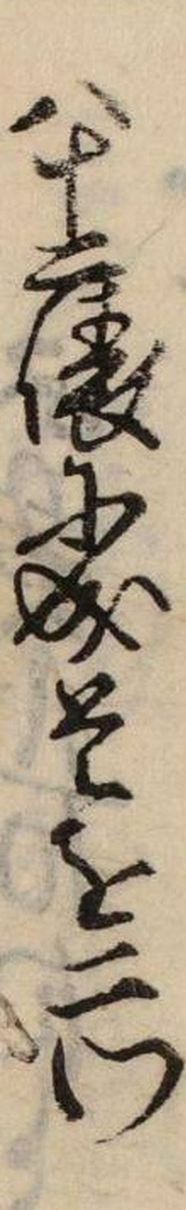八十二俵に成是を二つ
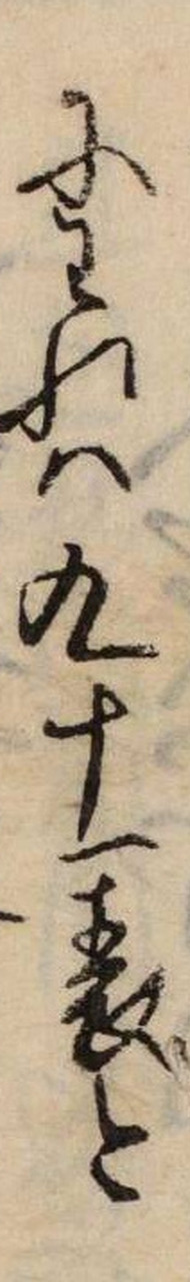にわれは九十一表と
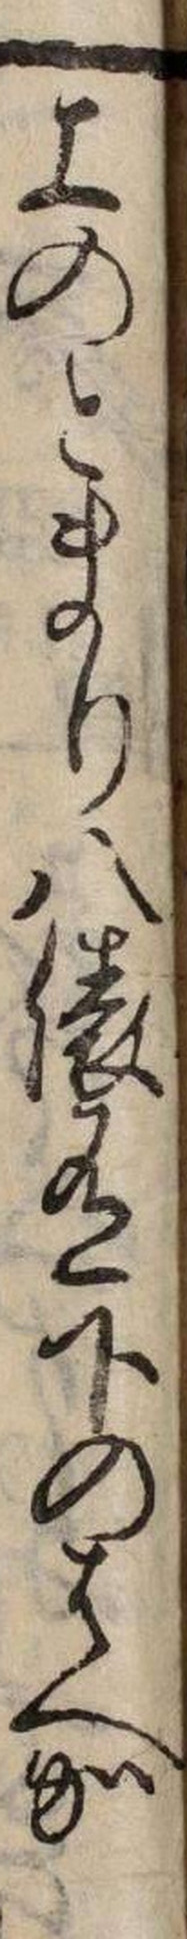上のとまり八俵有下のはへが
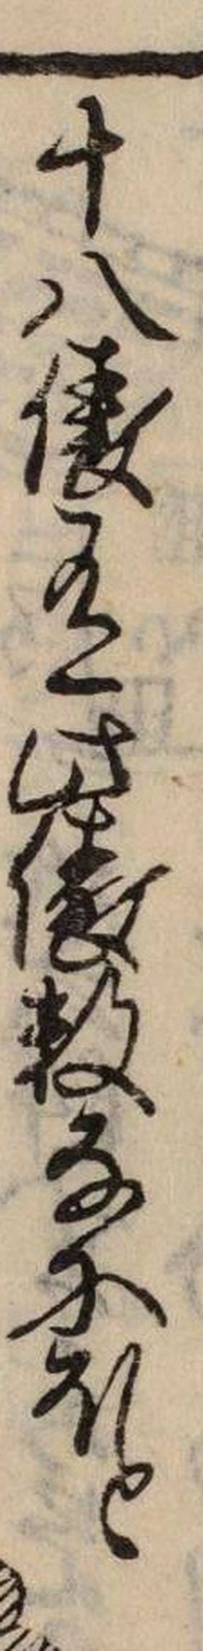十八俵有此俵数なにほと
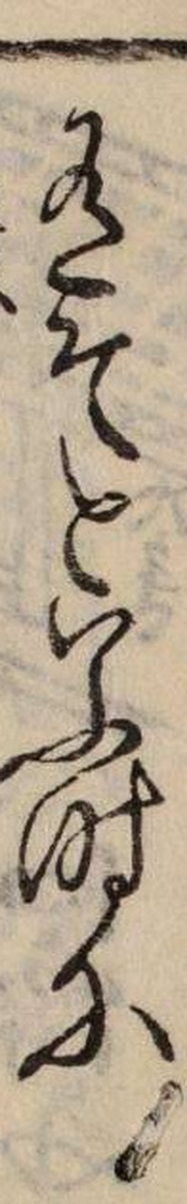有そといふ時に
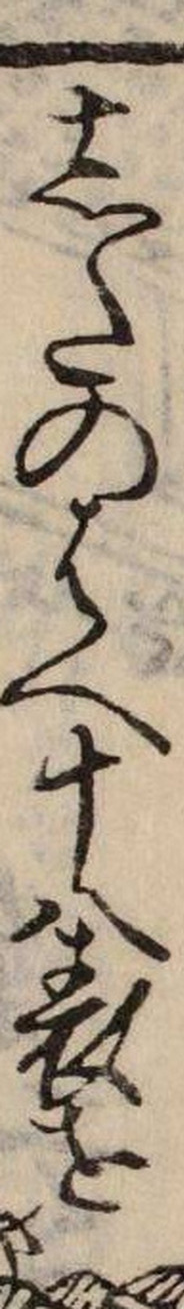したのはへ十八表を
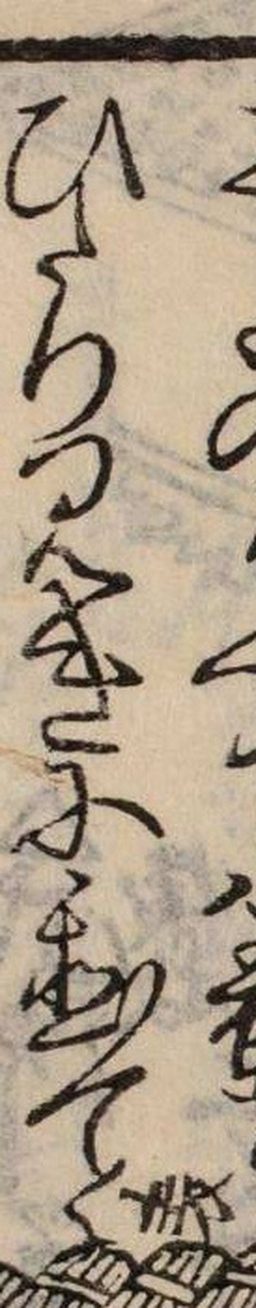ひたりみきに置て
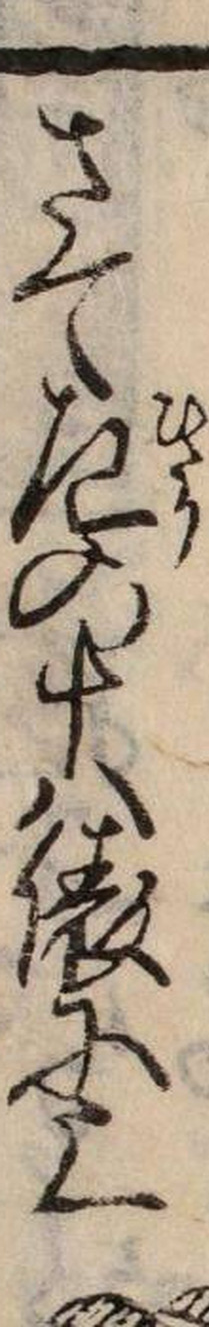さて左の十八俵に上
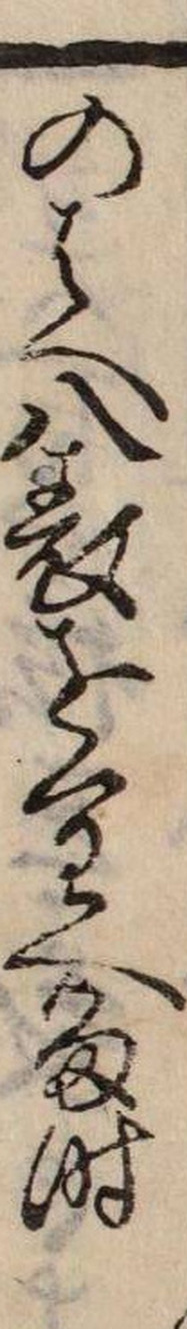のはへ八表をくわへる時
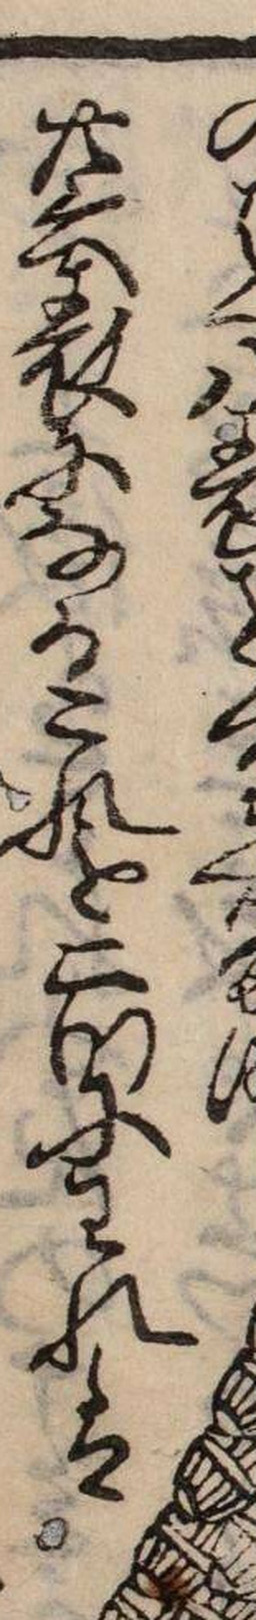廿六表になるこれを二つにわれは
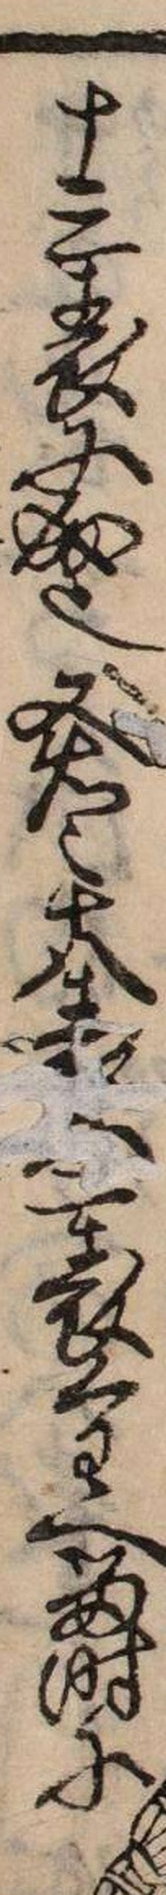十三表に成也又右の十八表に一表くわへる時に

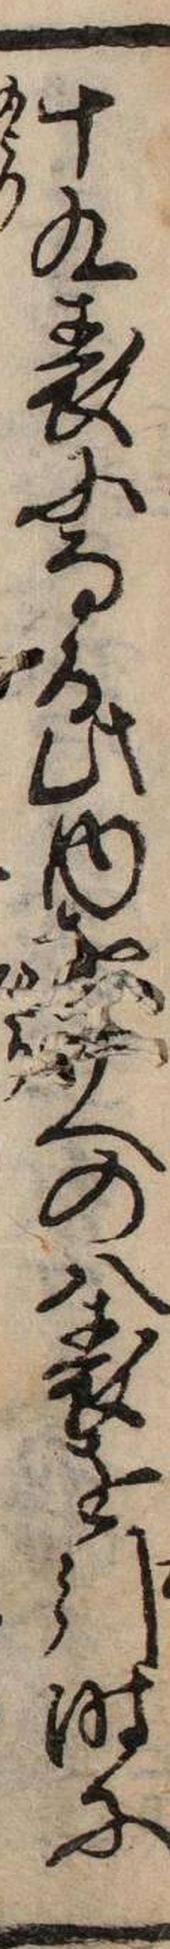十九表になる此内をうへの八表を引時に
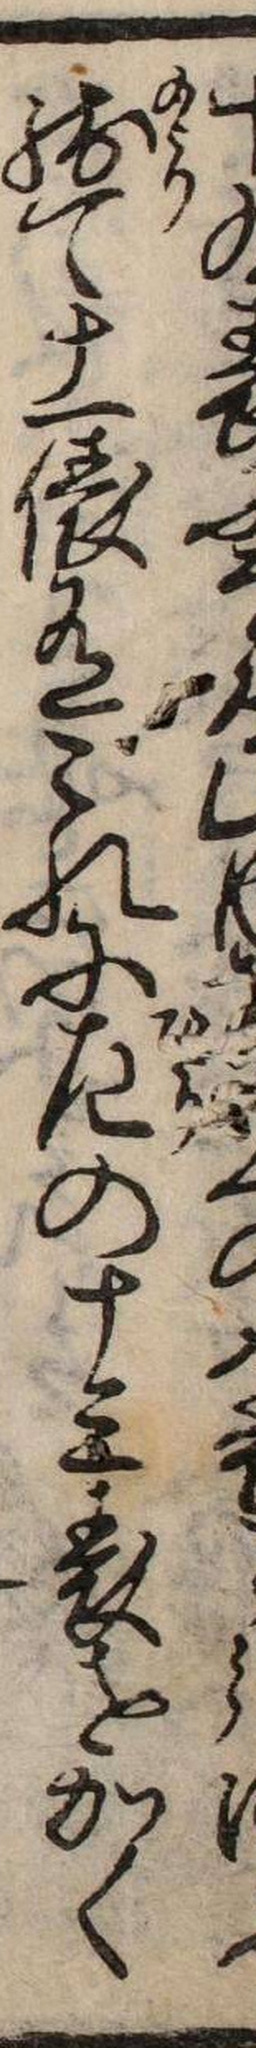残て十一俵有これに左の十三表をかく
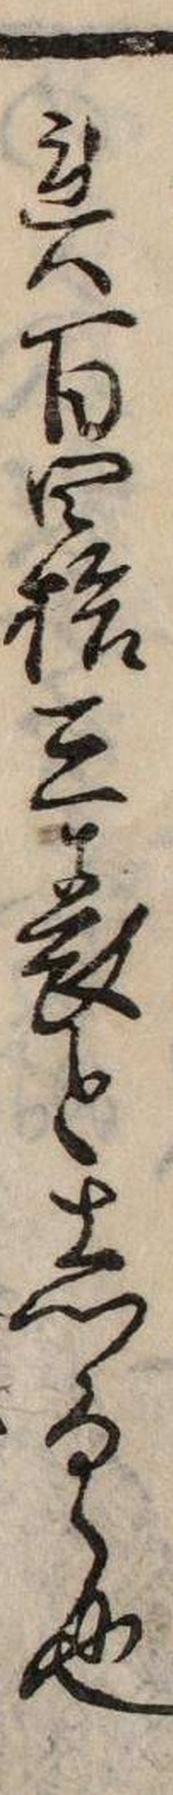れは百四拾三表としるゝ也
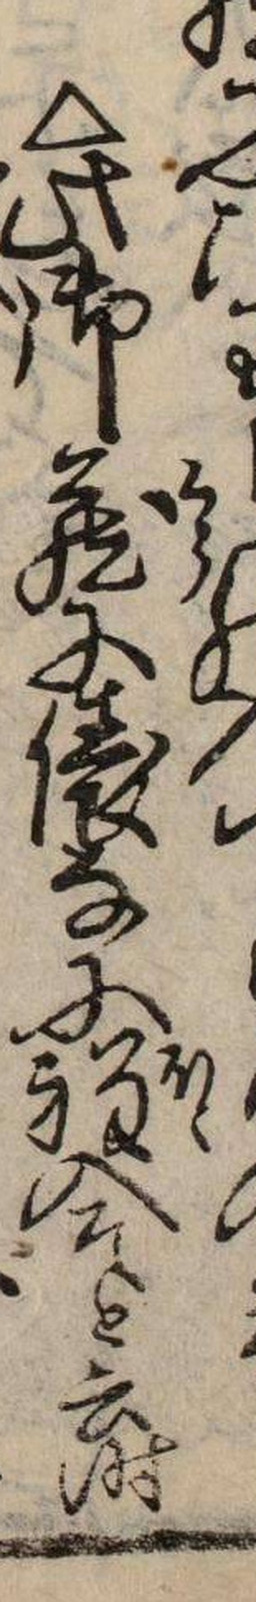△此御蔵に俵なに程入そと云時
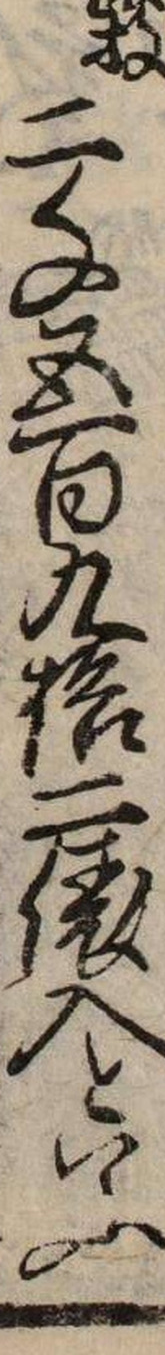俵数二千五百九拾二俵入といふ
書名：塵劫記（寛永11年自跋、京都府立京都学・歴彩館追貴8）
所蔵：京都府立京都学・歴彩館 国文学研究資料館
